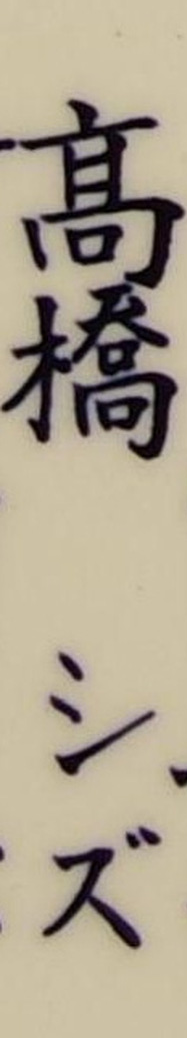高橋シズ
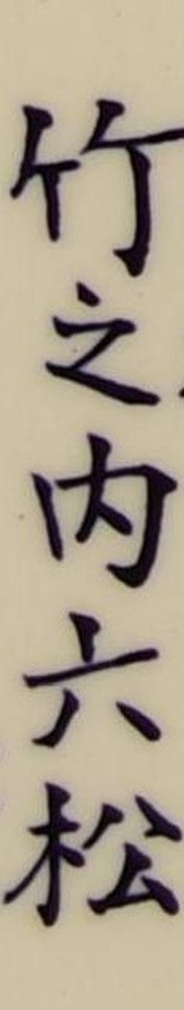竹之内六松
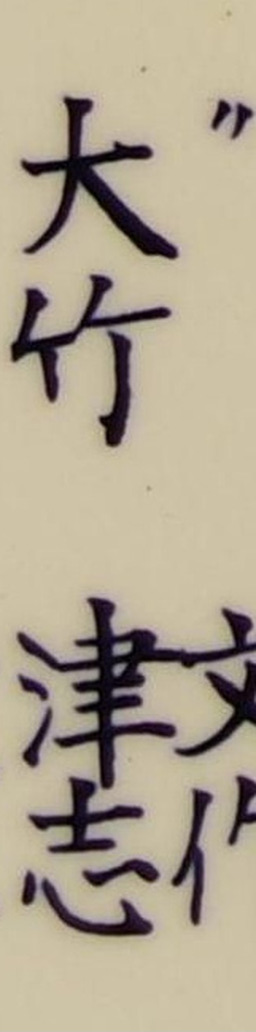大竹津志
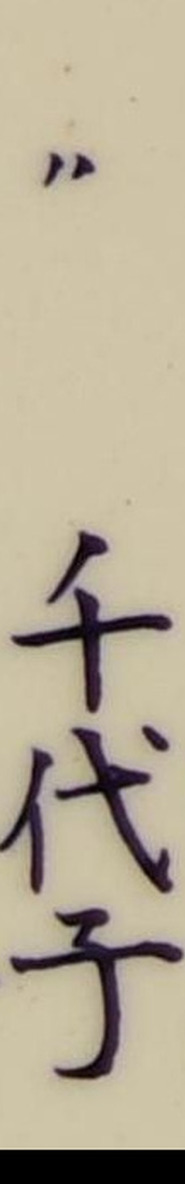千代子
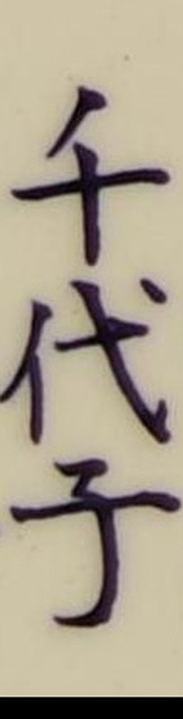千代子
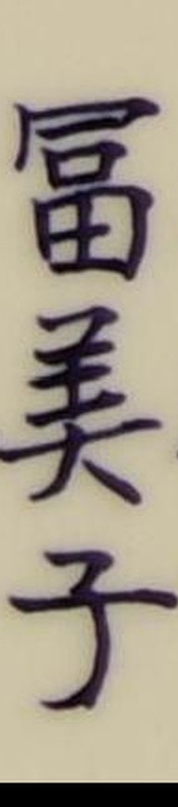冨美子
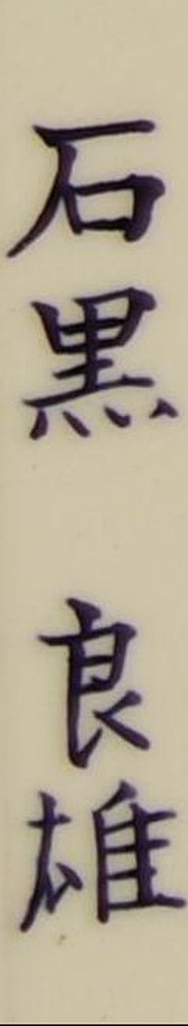石黒良雄

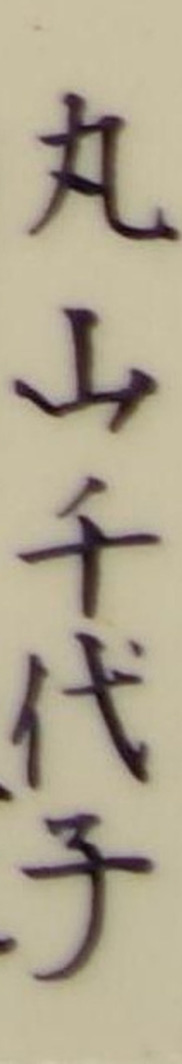丸山千代子
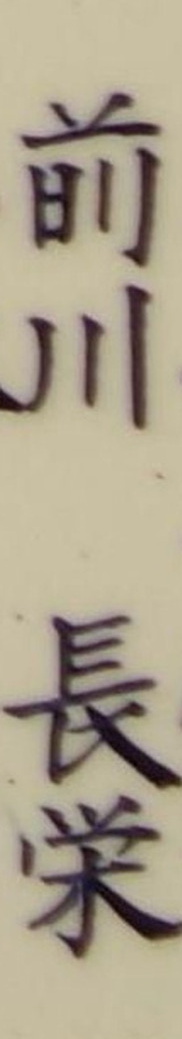前川長栄
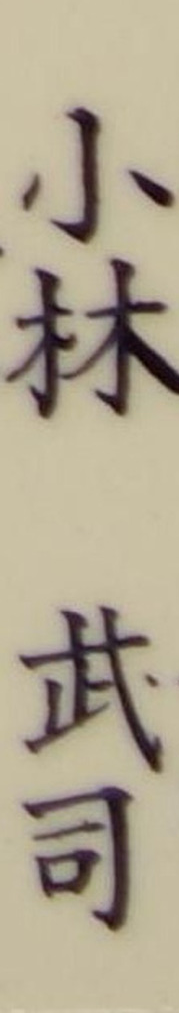小林武司
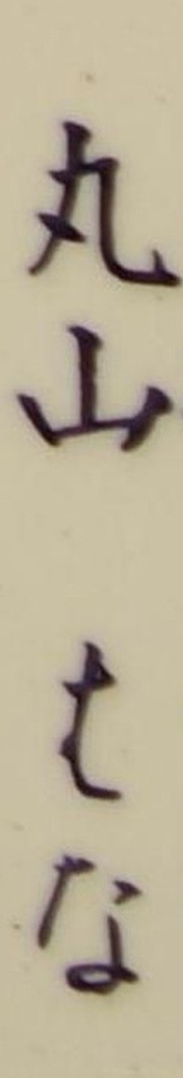丸山はな
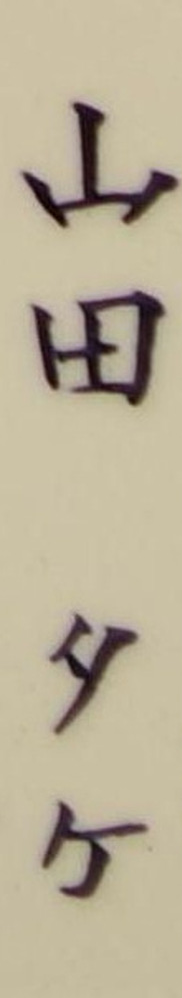山田夕ケ
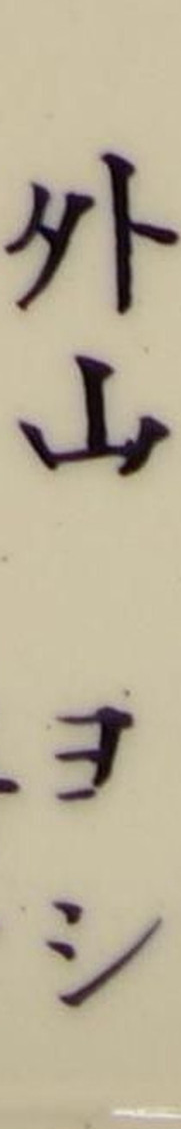外山ヨシ
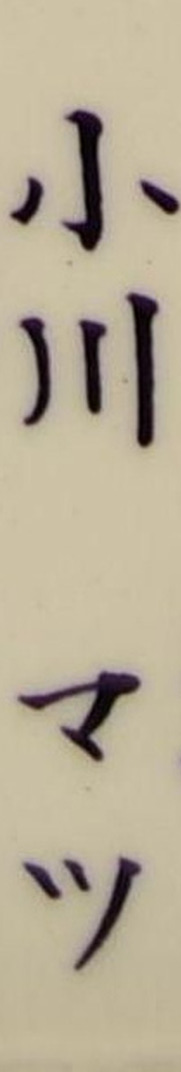小川マツ
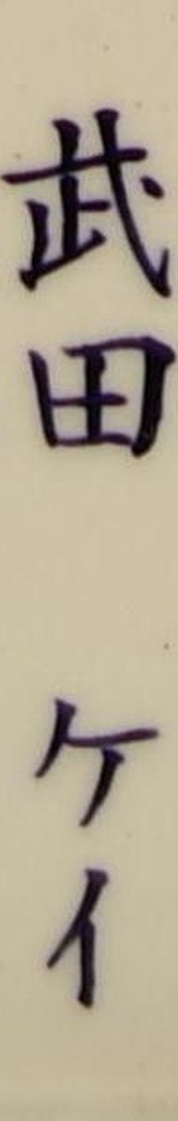武田ケイ
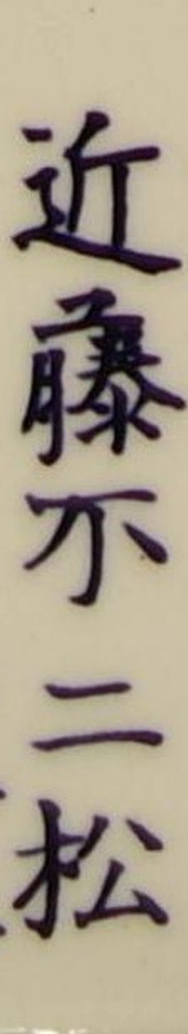近藤不二松
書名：E~L
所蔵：高野山金剛峯寺
